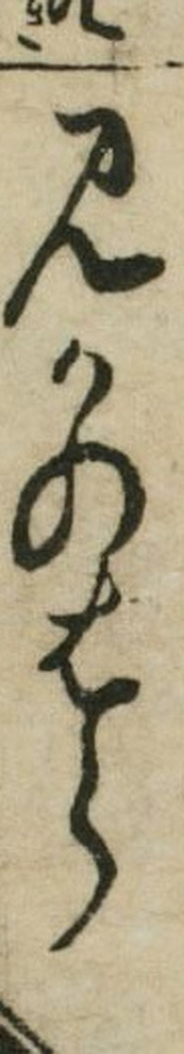みかのはら
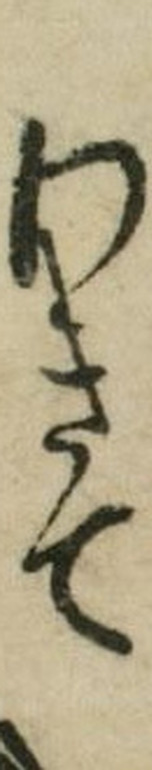わきて
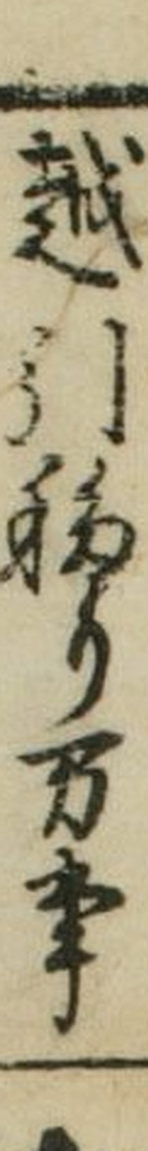越引移り万事
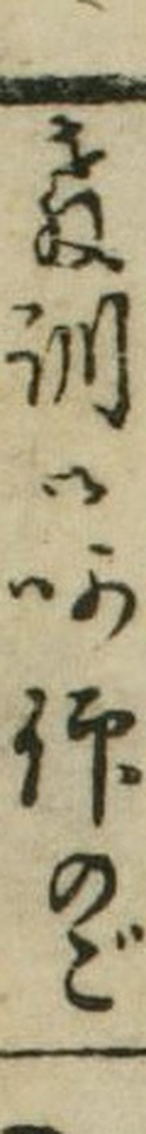教訓御呵仰のご
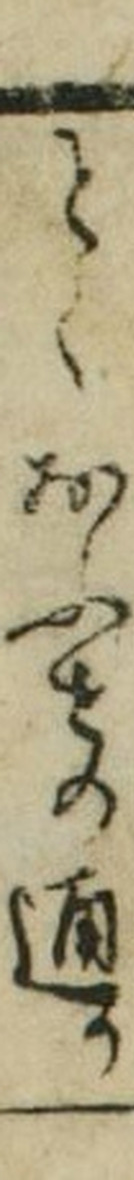とくおふせの通り
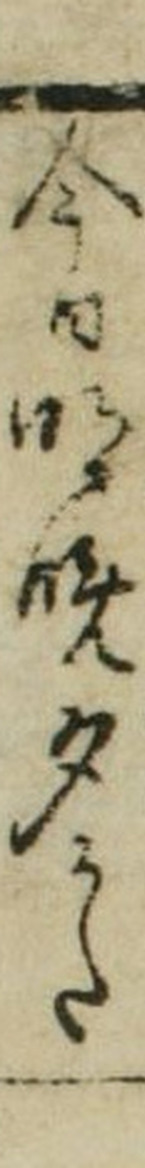今日明晩夕かた
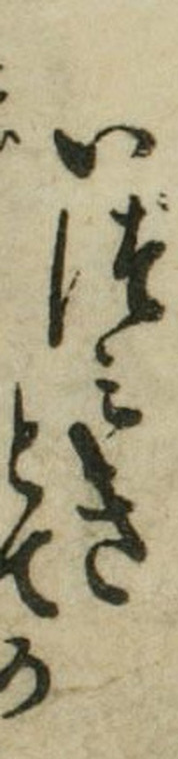いづみき
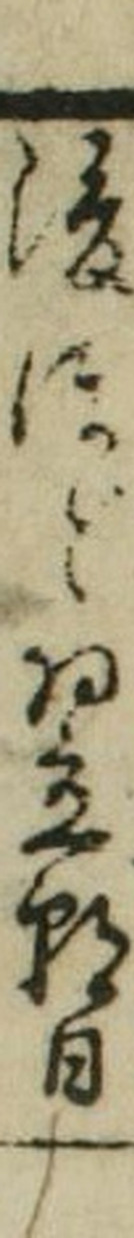後ほど翌朝日
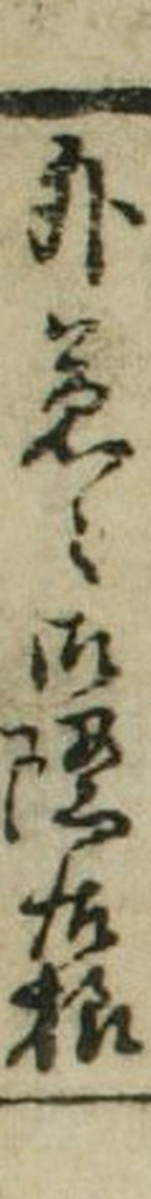外兼々御隠居様

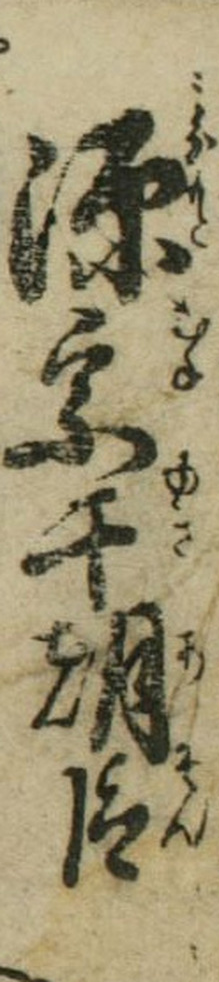源宗于朝臣
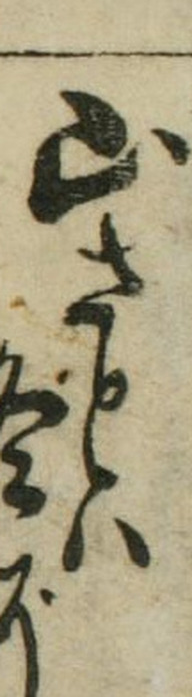山さとは
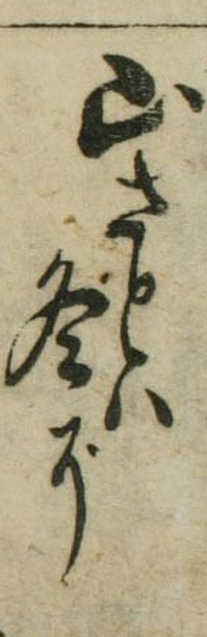山さとは
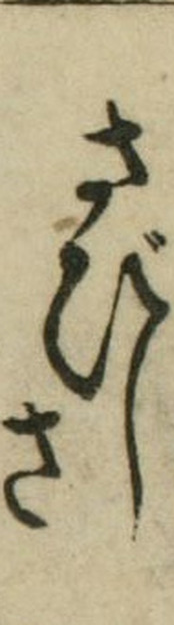さびしさ
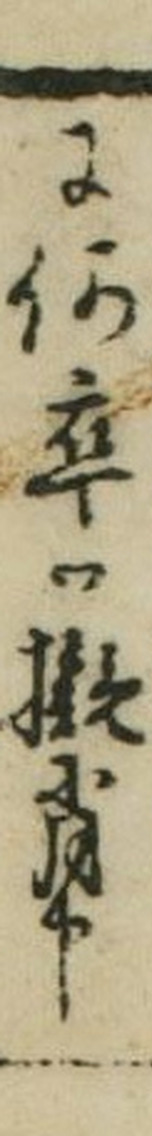に何卒御擬肖申
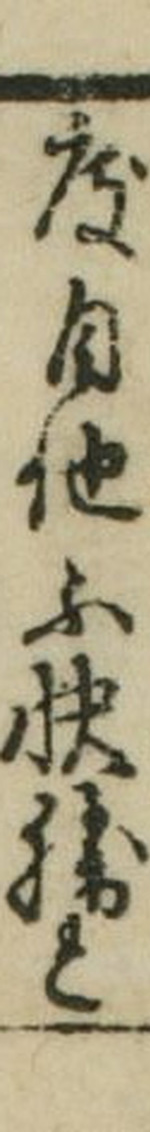度自他不快勝れ
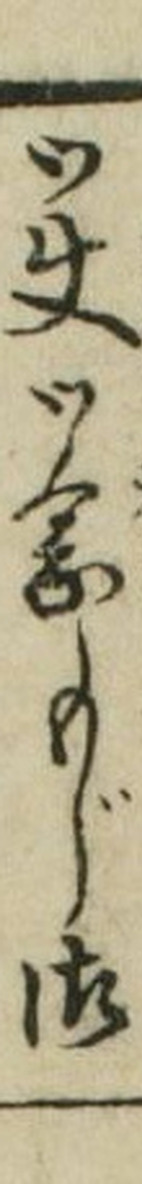御使御念もじ御
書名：百人一首
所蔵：東京学芸大学教育コンテンツアーカイブ
